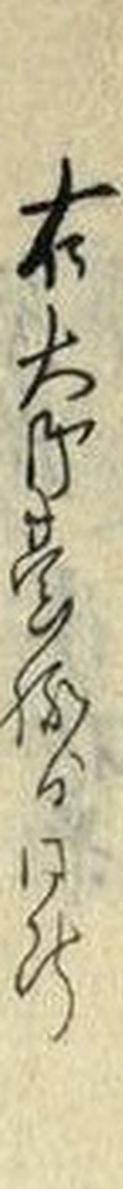右大御台様ゟ同断
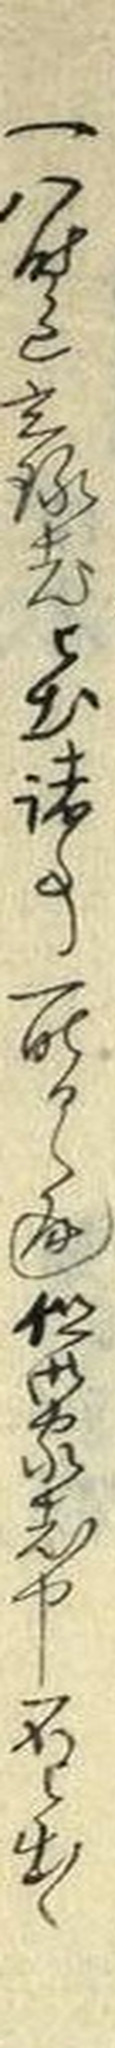一八時過玄琢老被出諸事一昨日之通但御家老中不被出候
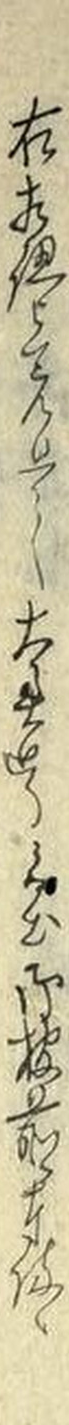右相認被差上之大奥廻りニ而出御棺前へ奉備候
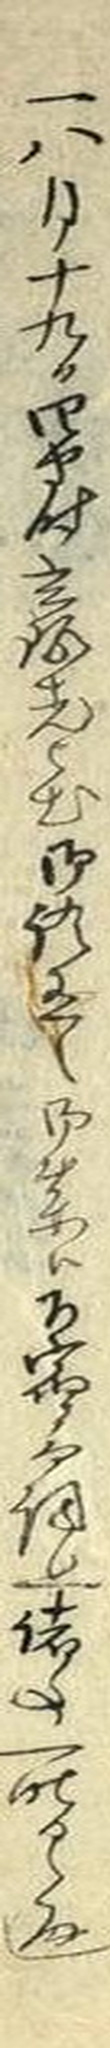一八月十九日四半時玄琢老被出御診有之御薬ハ下宿ニ而調上諸事一昨日之通
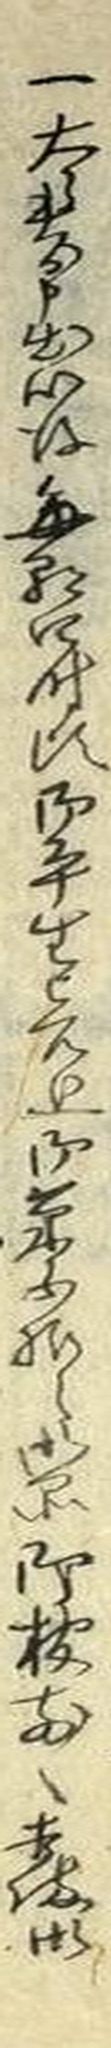一大奥ゟ申出以後毎朝四時頃御平生被召上御菓子様之御品御棺前へ相備御
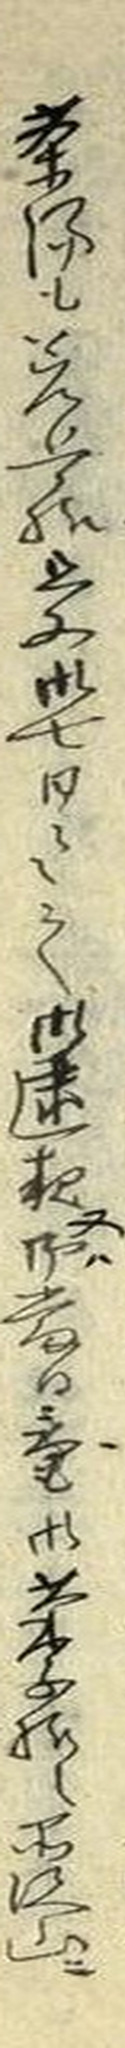茶湯も差上候様且又御七日々々之御逮夜又ハ御当日ニ而も御菓子様之品沢山ニ
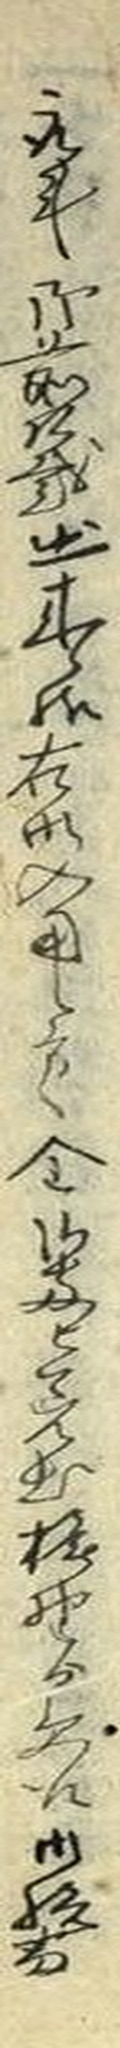取斗御前頂戴出来候様右御入用之方へ金弐両被差出梶野ゟ受取御膳番
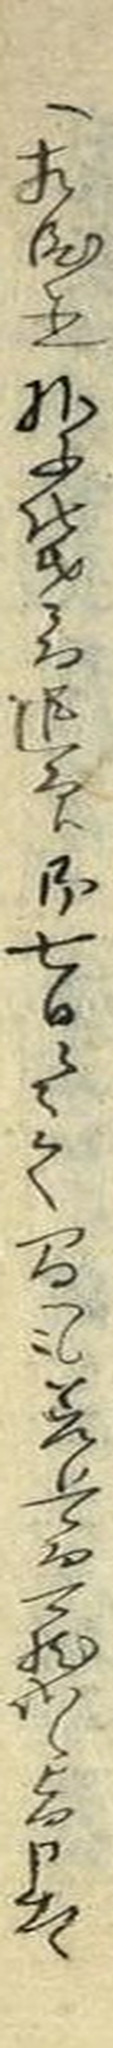へ相渡置様子次第ニ而追而ハ御七日々々之間へも差上候而可然哉候旨申出候
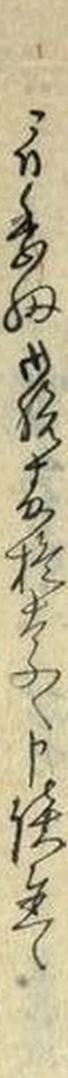ニ付委細御膳番権太夫へ申談置候
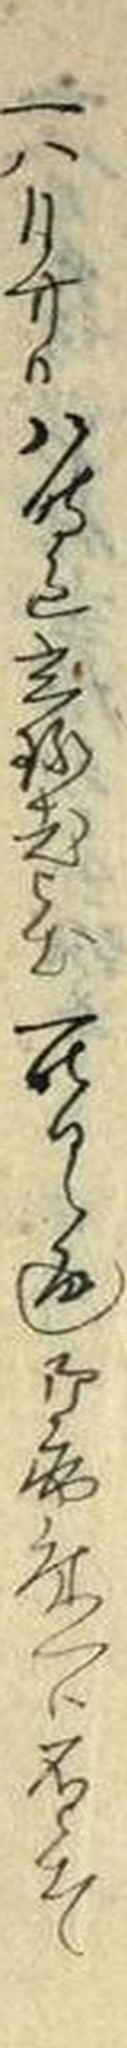一八月廿日八時過玄琢老被出一昨日之通御病床へハ不被出候

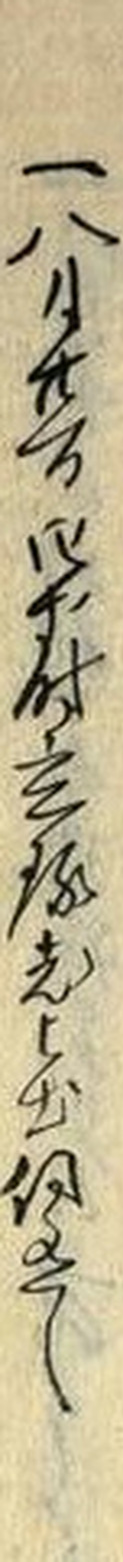一八月廿一日四半時玄琢老被出伺有之
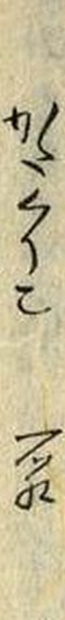かたくりこ一箱
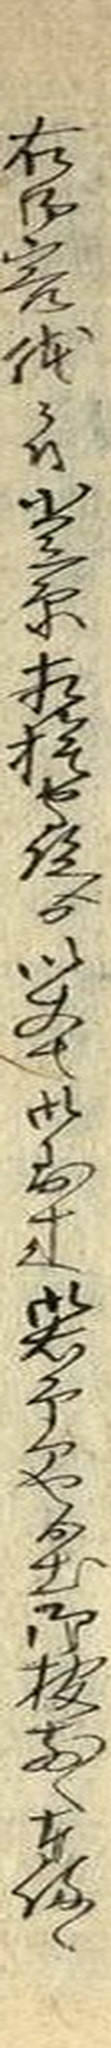右御容体二付小笠原相模守殿ゟ御使者御到来御右筆部やゟ出御棺へ奉備候
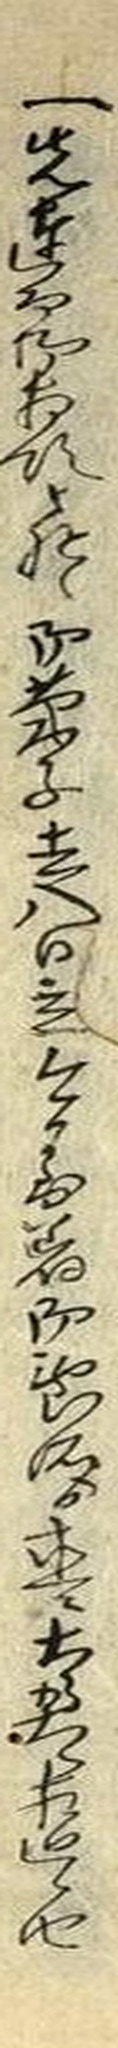一先達而御拝領被遊候御菓子去八日立今日到着御台所ゟ直二大奥へ相廻候由
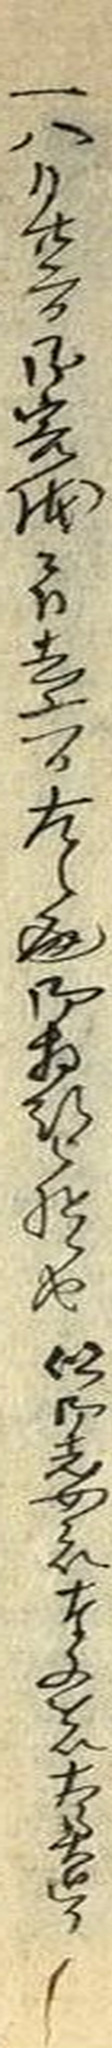一八月廿二日御容体二付去六日左之通御拝領被遊候由但御老女衆奉文を以大奥廻り
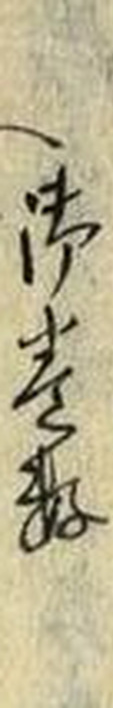御巻数
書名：少傅日録抄（斉善付側向頭取日記、江戸并道中、初入在国、逝去後…
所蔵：福井県文書館 Fukui Prefectural Archives
